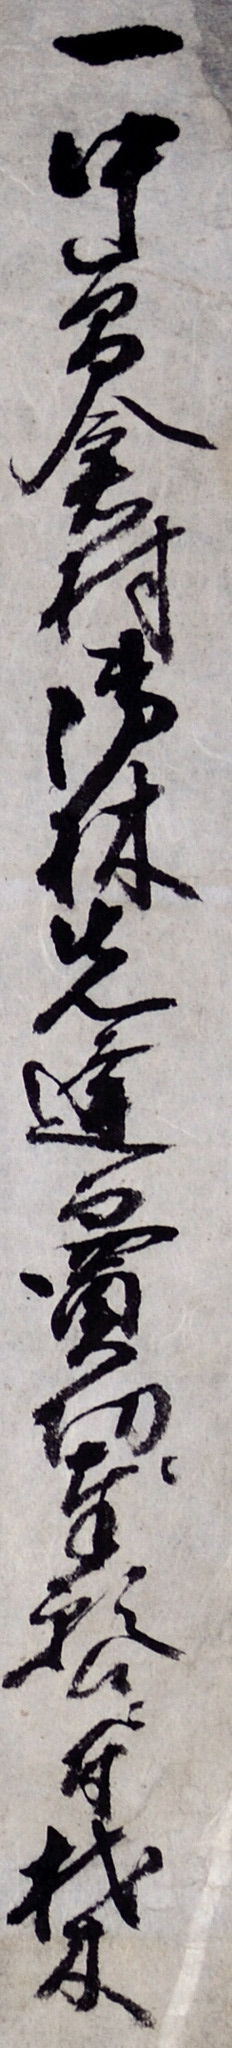一中曽倉村御林先達而買切ニ奉願候ニ付材木
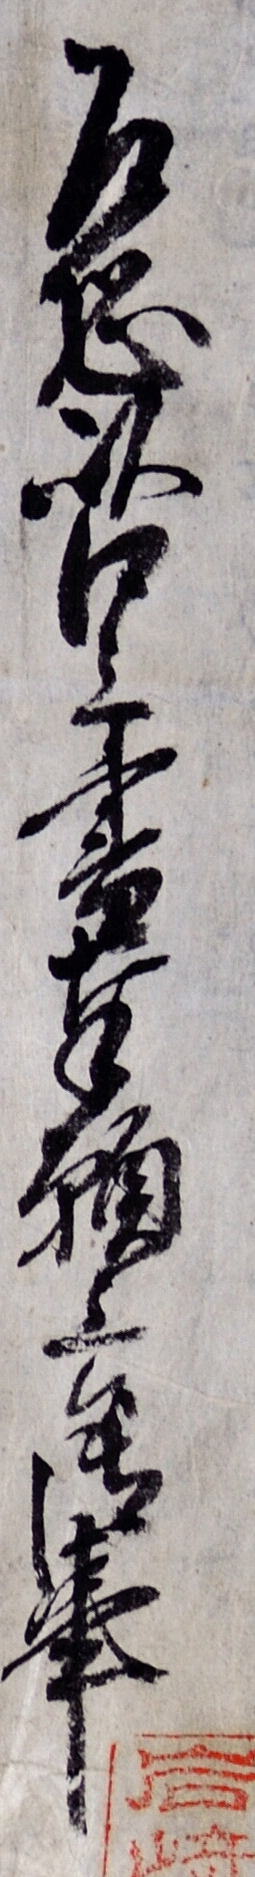乍恐以口上書奉願上候御事
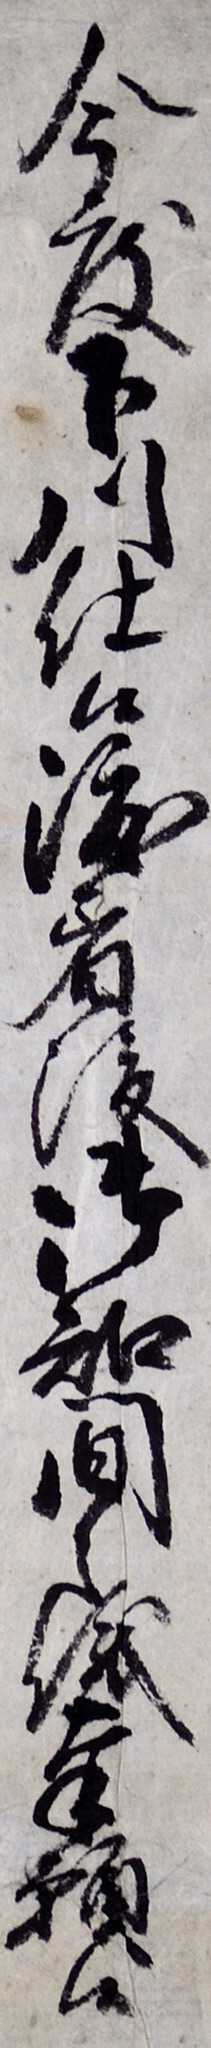今度下川仕候渡着後御知間之儀奉願候
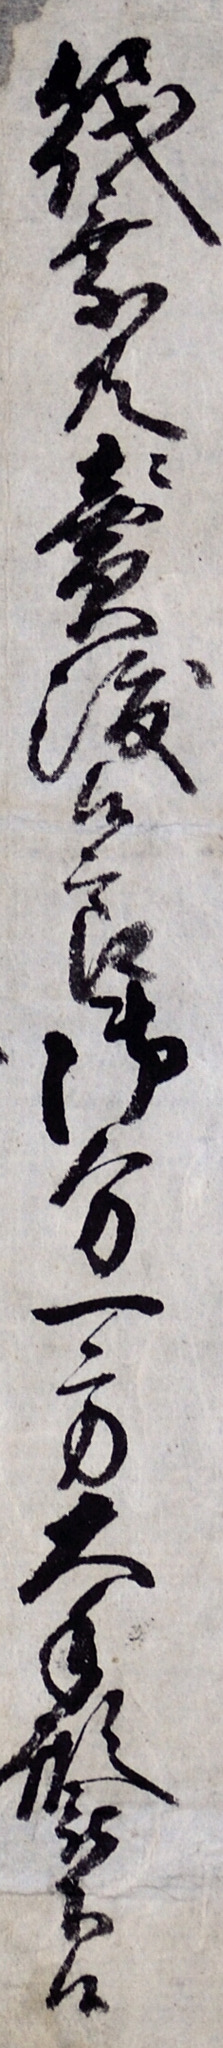筏乗共ニ売渡候節御分一方大手形被下候
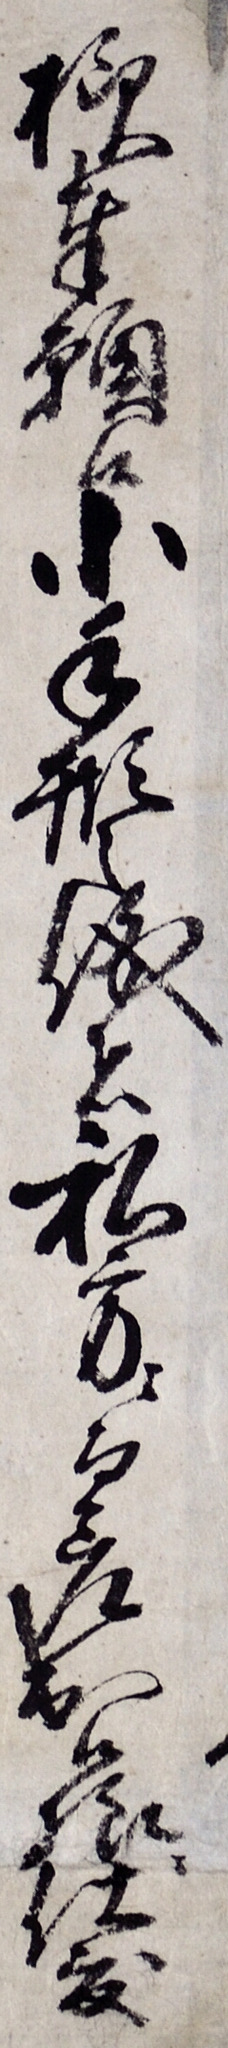様奉願候小手形之儀者私方ニ而差出候様二仕度
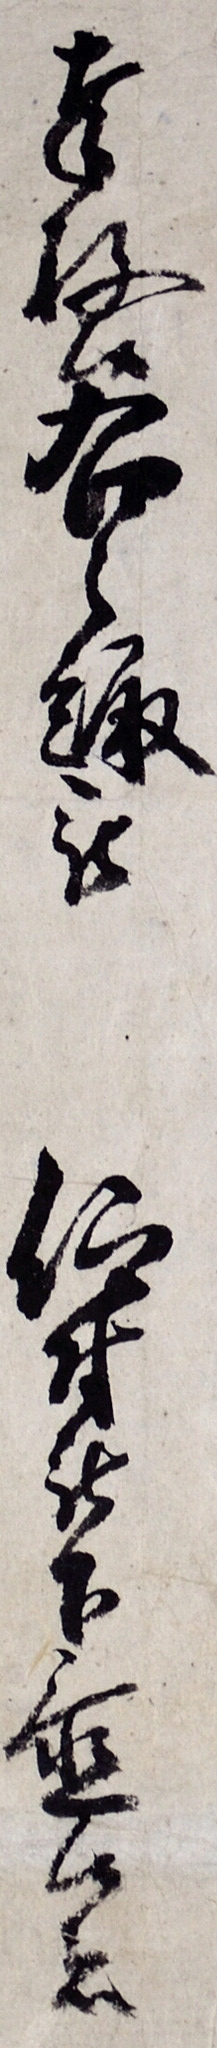奉存候右之趣被仰付被下置候者
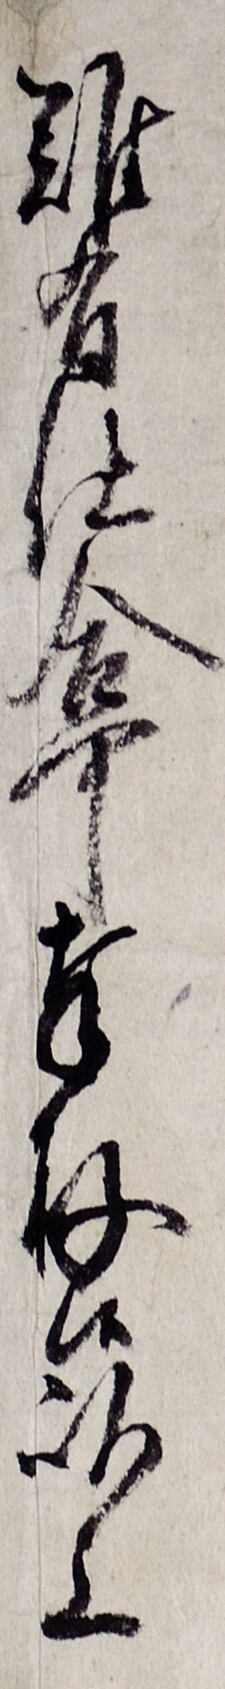難有仕合可奉存候以上
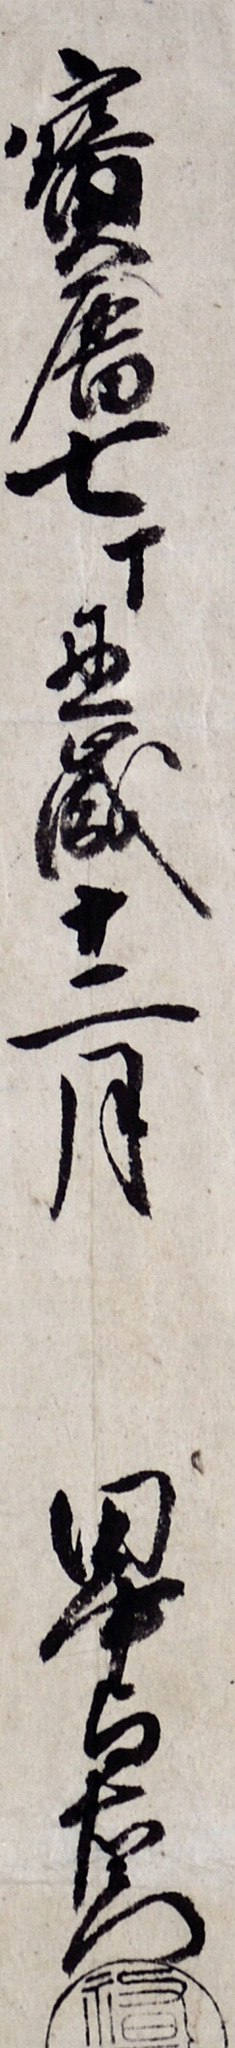宝暦七丁丑歳十二月田中与右衛門㊞
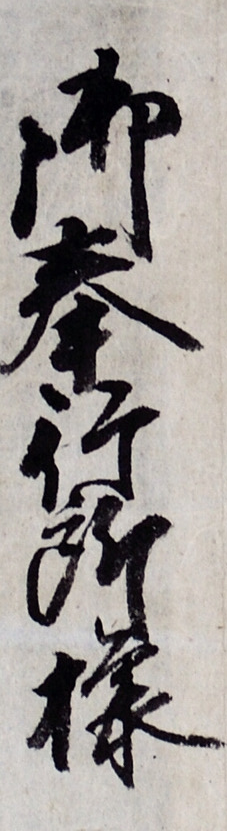御奉行所様
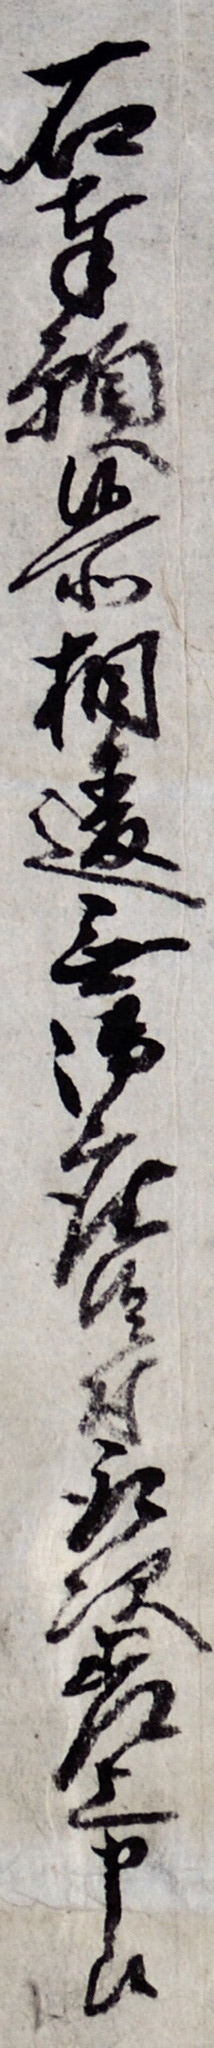右奉願候所相違無御座候二付取次差上申候
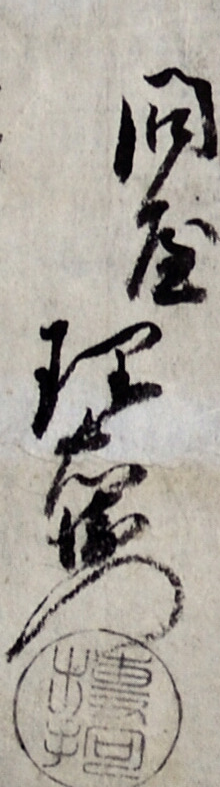問屋理右衛門㊞
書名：乍恐以口上書奉願上候御事
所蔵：伊那市立高遠町図書館・合同会社AMANE
